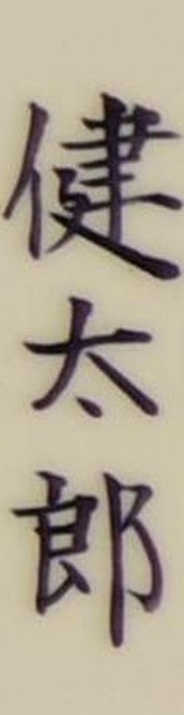健太郎

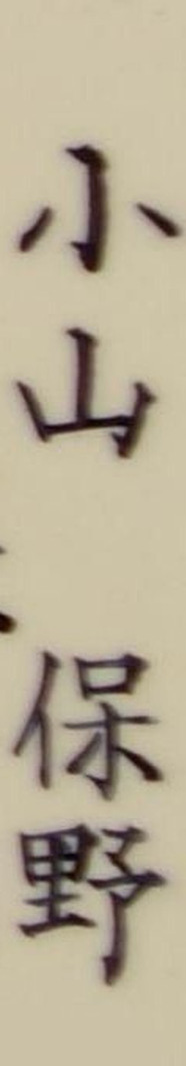小山保野
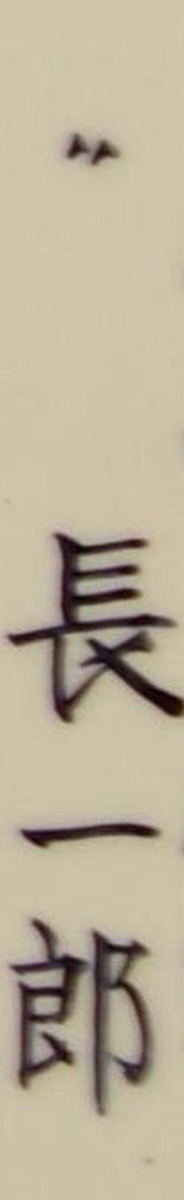長一郎
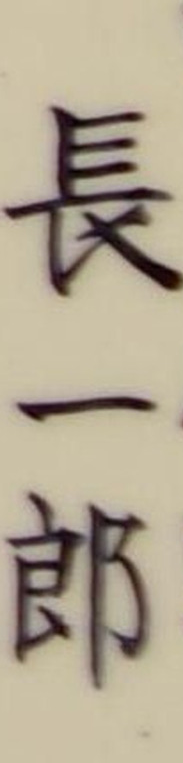長一郎
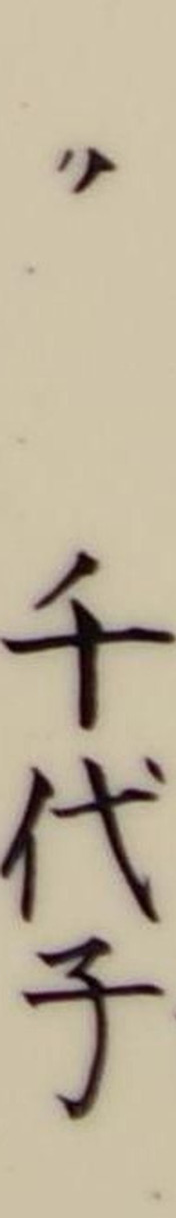千代子
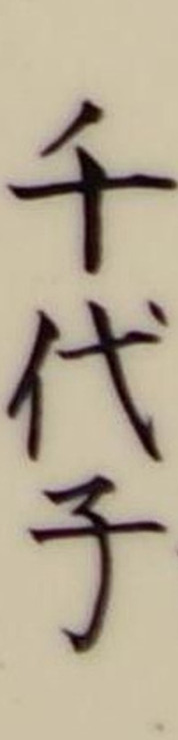千代子
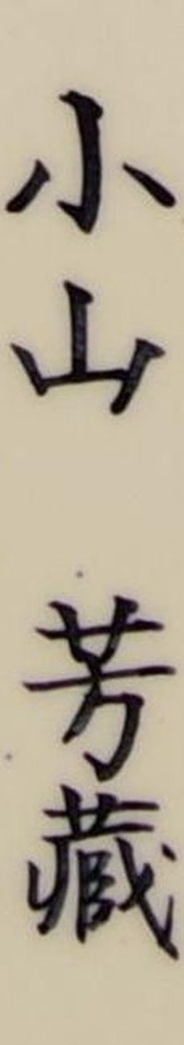小山芳蔵
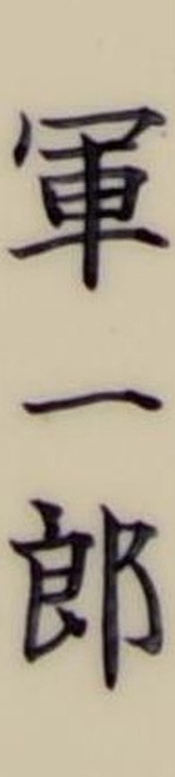軍一郎
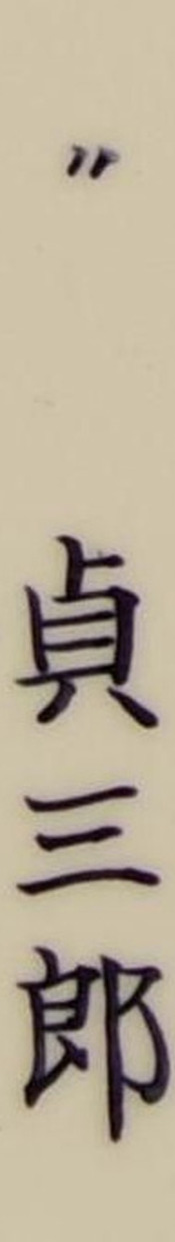貞三郎
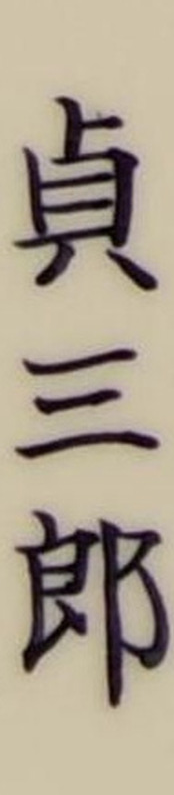貞三郎
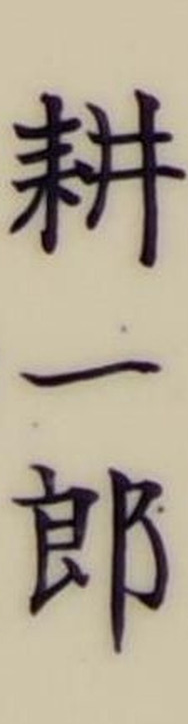耕一郎
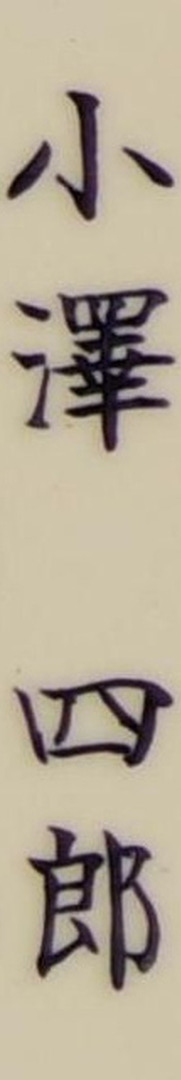小澤四郎
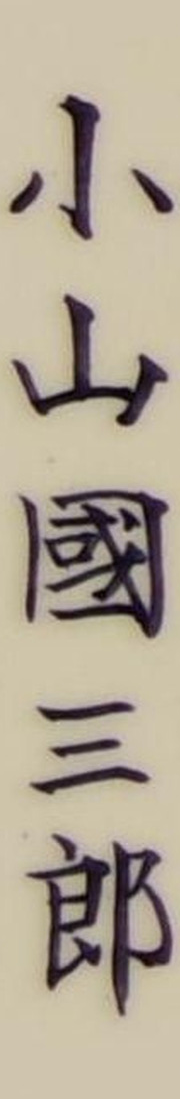小山國三郎

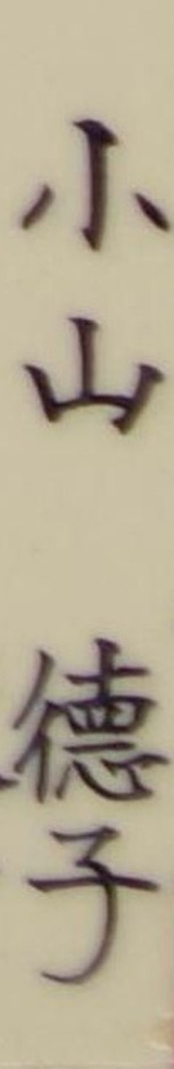小山徳子
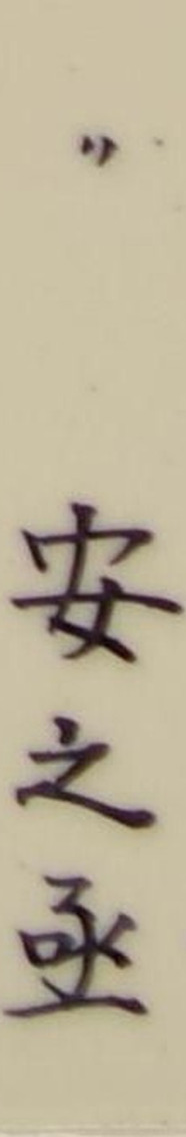安之丞
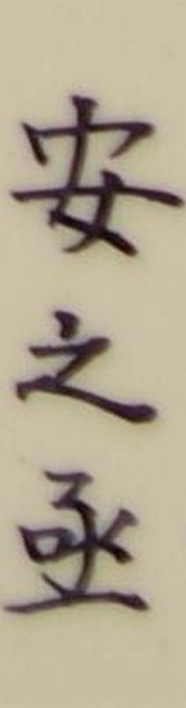安之丞
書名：E~L
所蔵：高野山金剛峯寺
